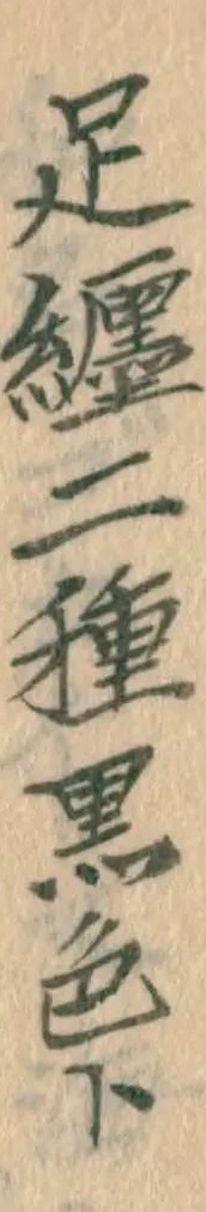足纒二種黒色ト
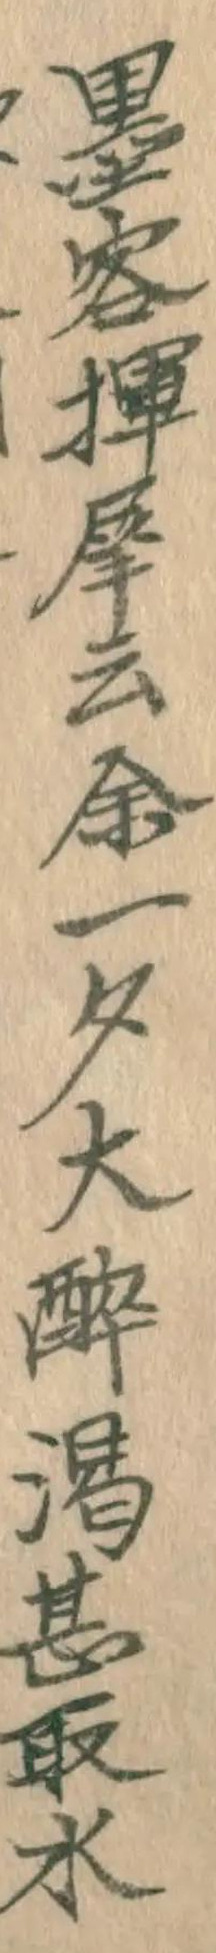墨客揮犀云余一夕大酔渇甚取水
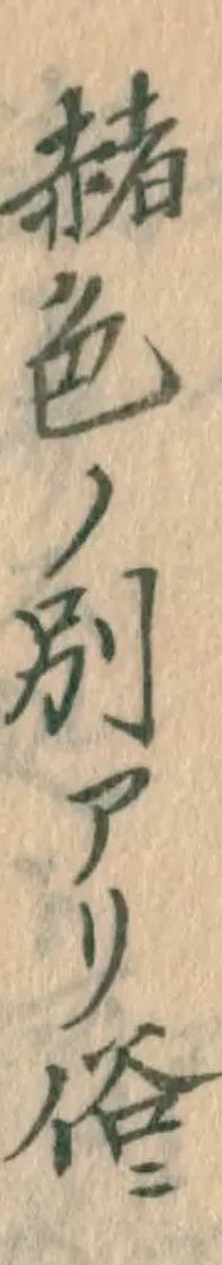赭色ノ別アリ俗ニ
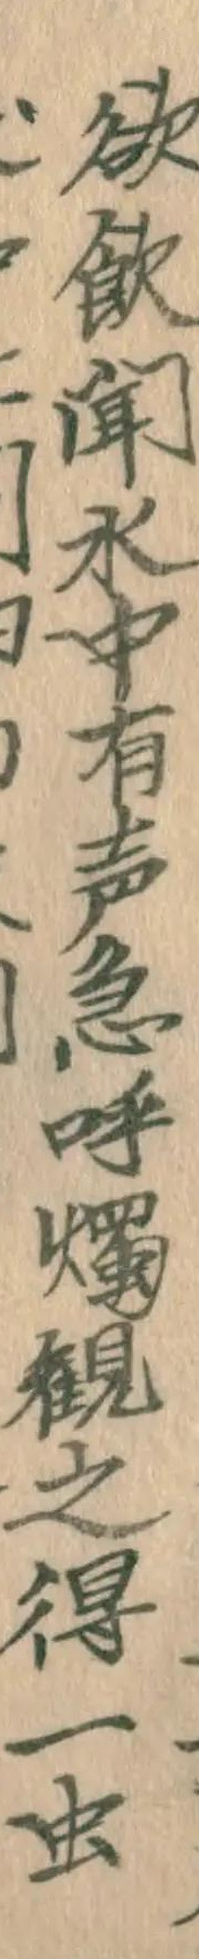欲飲聞水中有声急呼燭観之得一虫
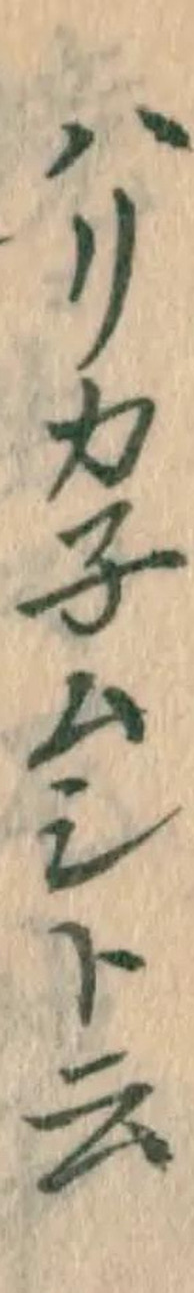ハリカネムシト云
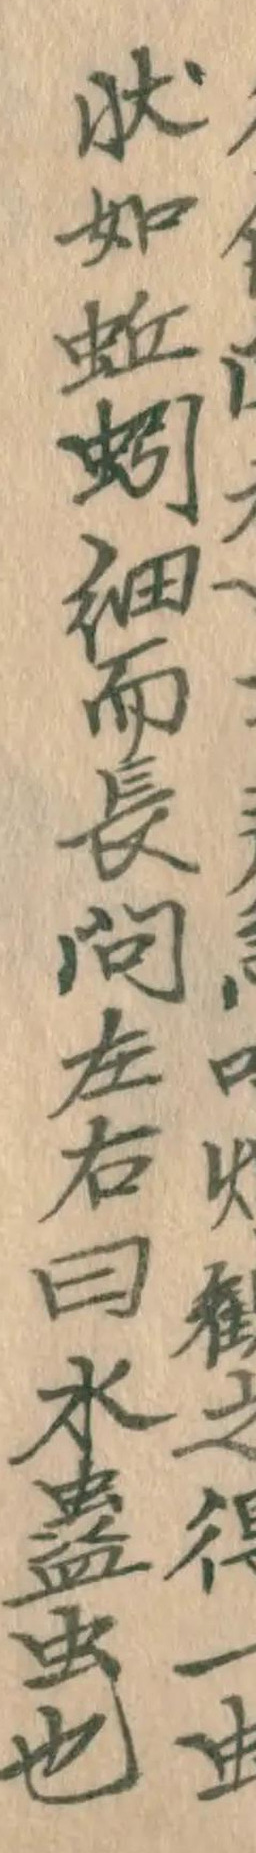状如蚯蚓細而長問左右曰水蠱虫也
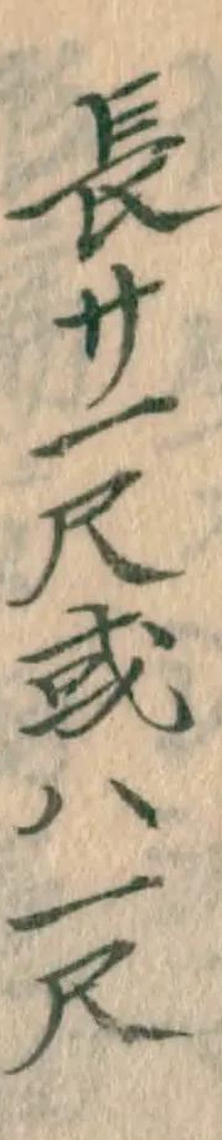長サ一尺或ハ一尺
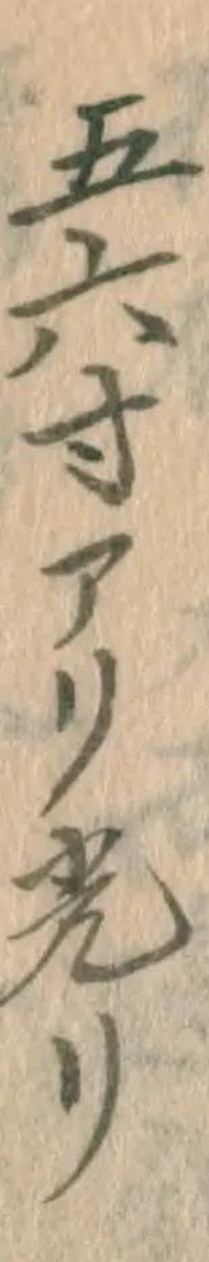五六寸アリ光リ
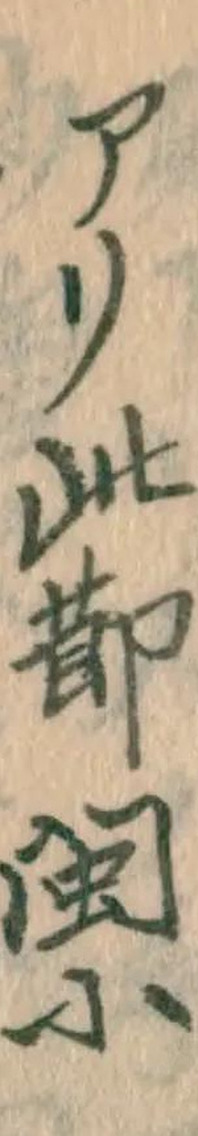アリ此莭閩小
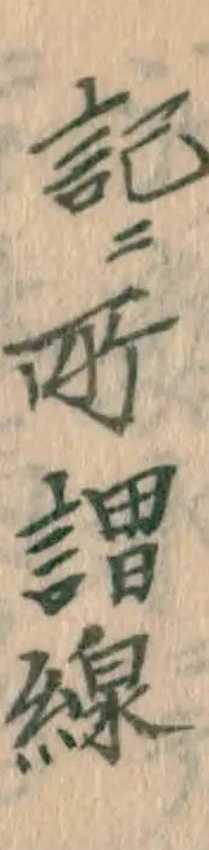記ニ所謂線
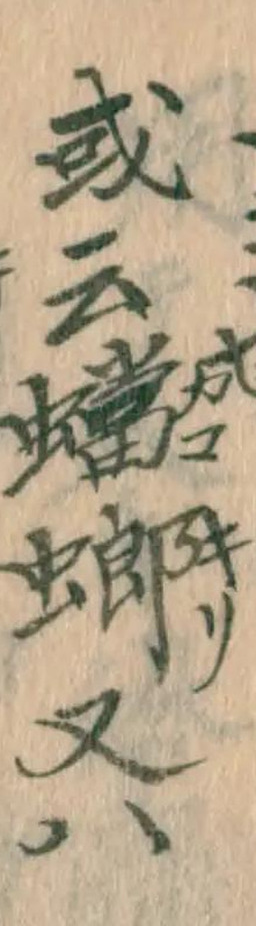或云蟷螂又ハ
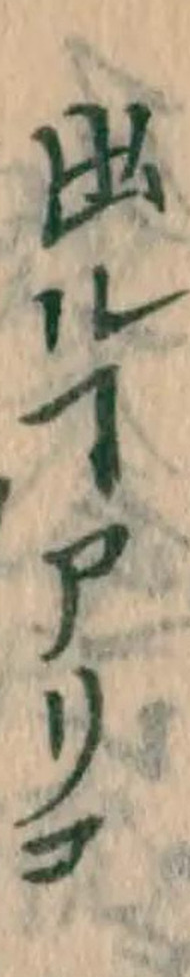出ルコトアリコ
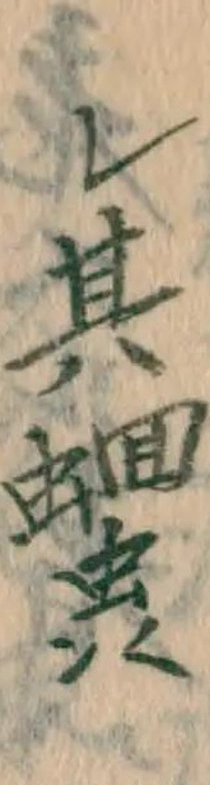レ其蛔蟲
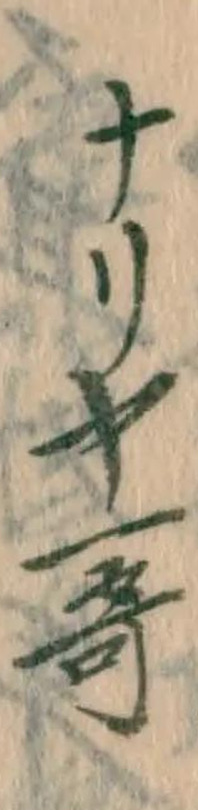ナリヤ一奇
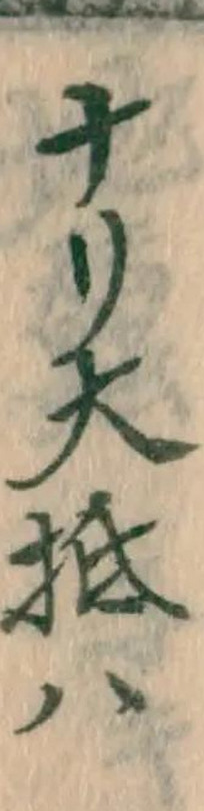ナリ大抵ハ
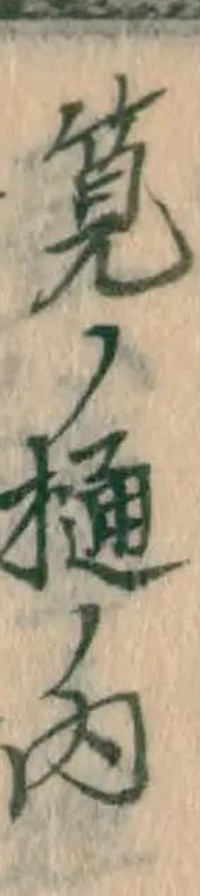筧ノ樋ノ内
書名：千蟲譜 3巻. [2]
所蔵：国立国会図書館 National Diet Library, JAPAN
